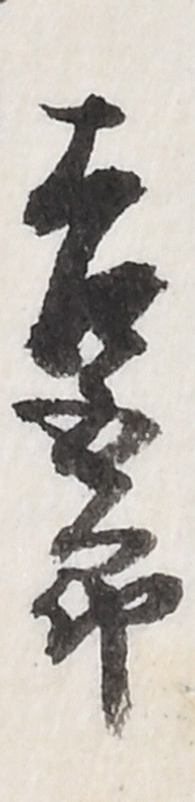吉五郎
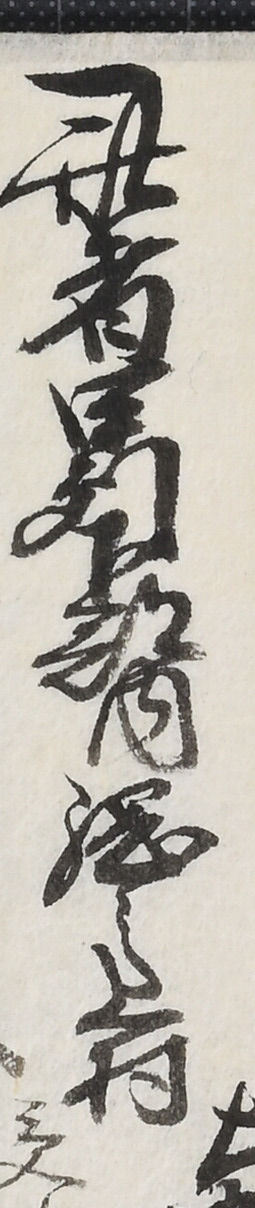一此者甲州下郡内綱之上村
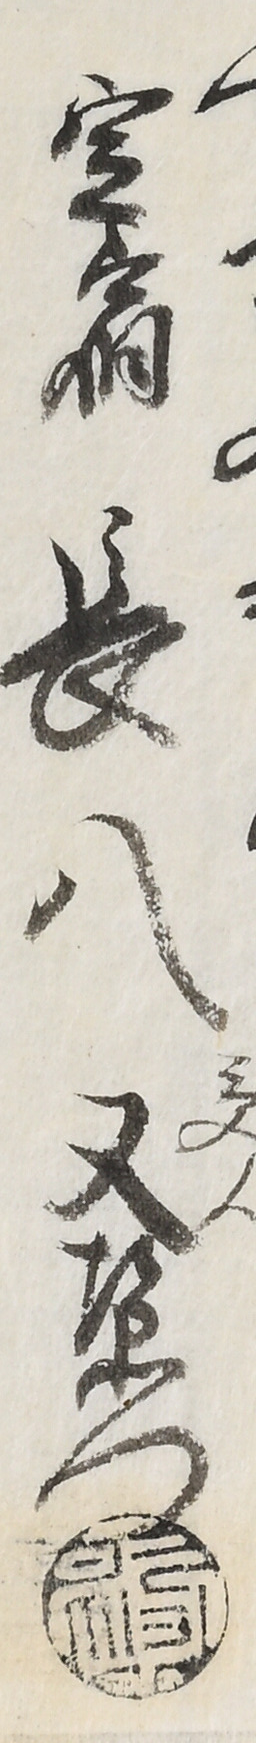定宿長八又左衛門(印)
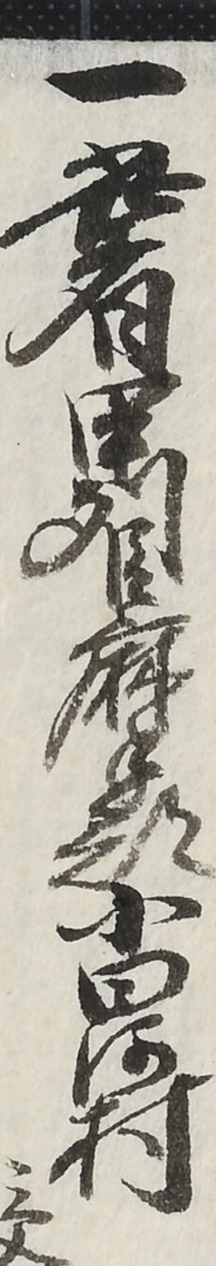一此者甲州巨摩郡小田河村
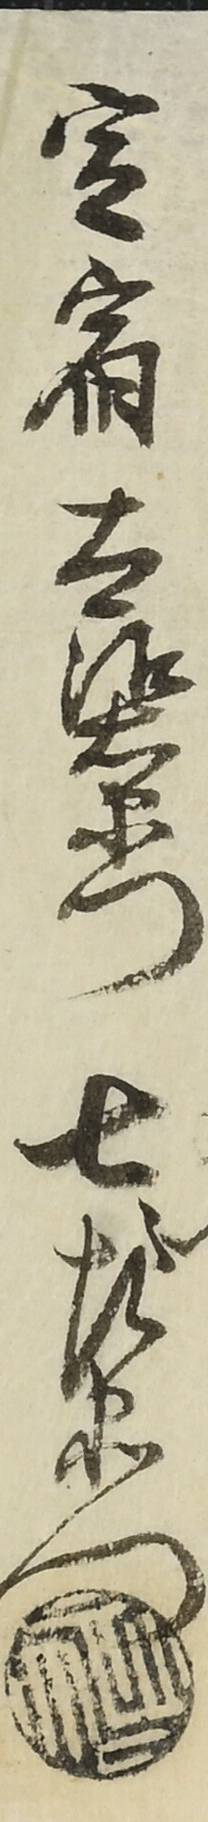定宿多治右衛門七郎左衛門(印)

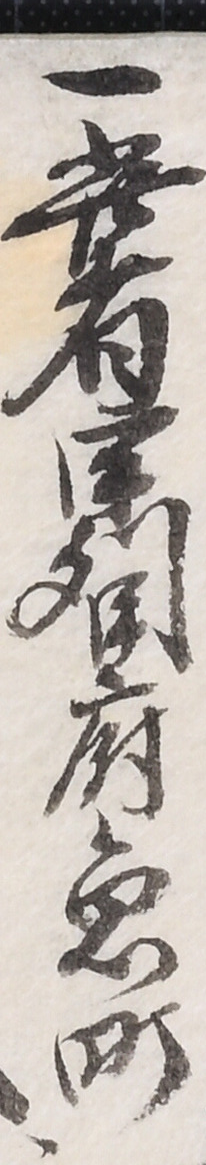一此者甲州甲府魚町
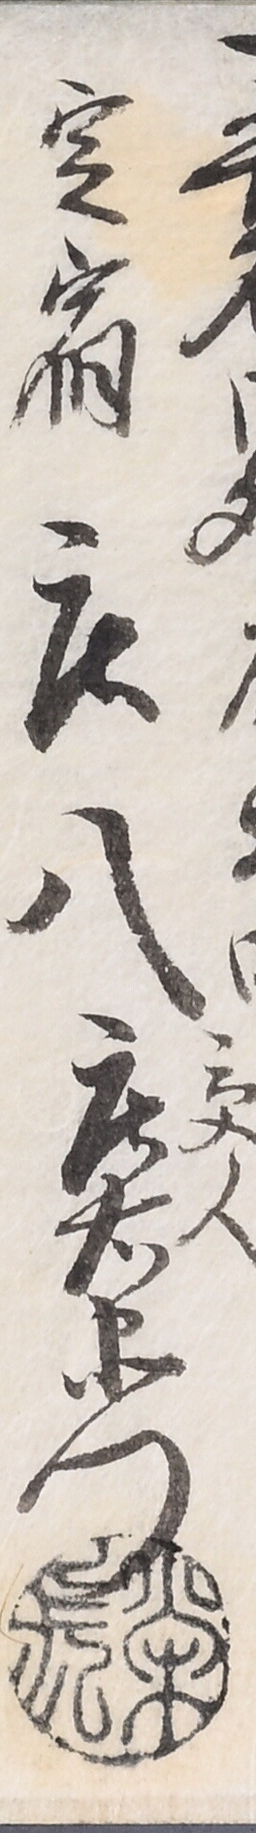定宿庄八庄右衛門(印)
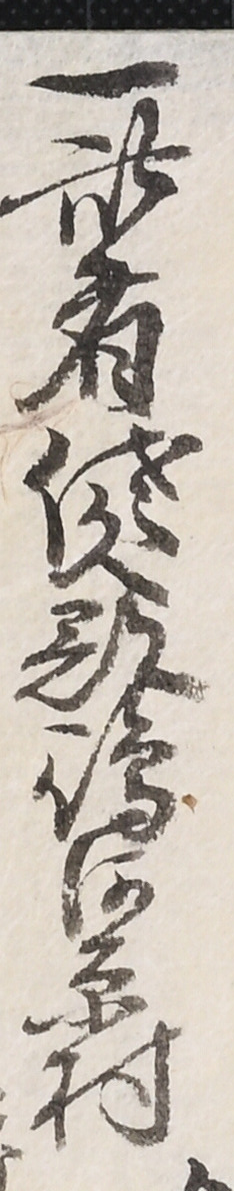一此者佐久郡嶋河原村
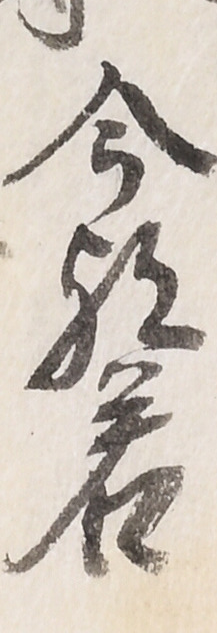今朝若
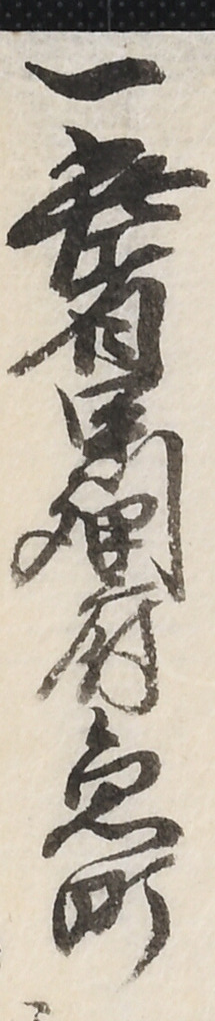一此者甲州甲府魚町
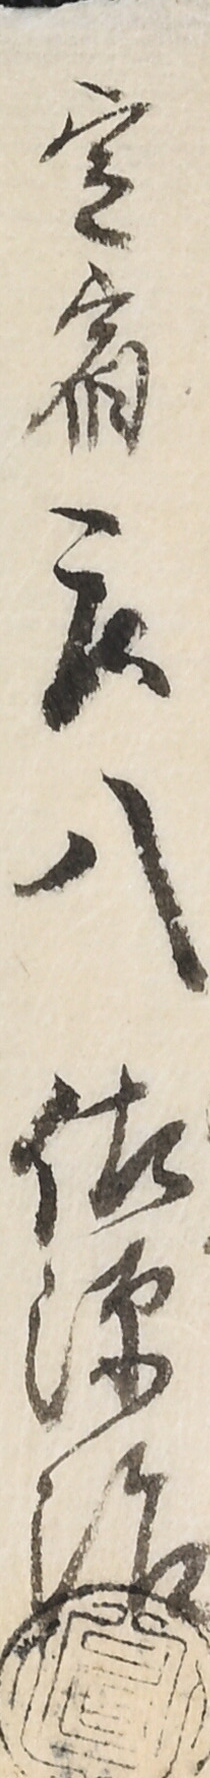定宿庄八佐源治(印)
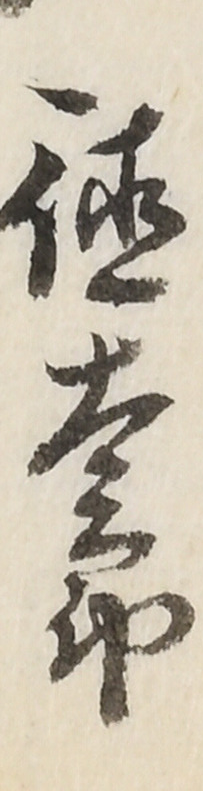国太郎
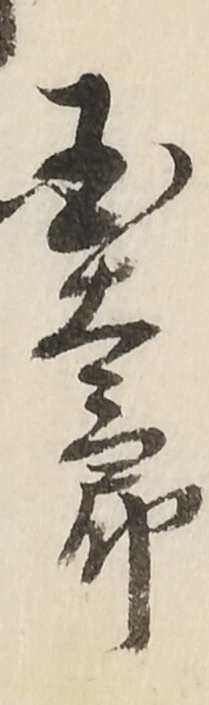国太郎
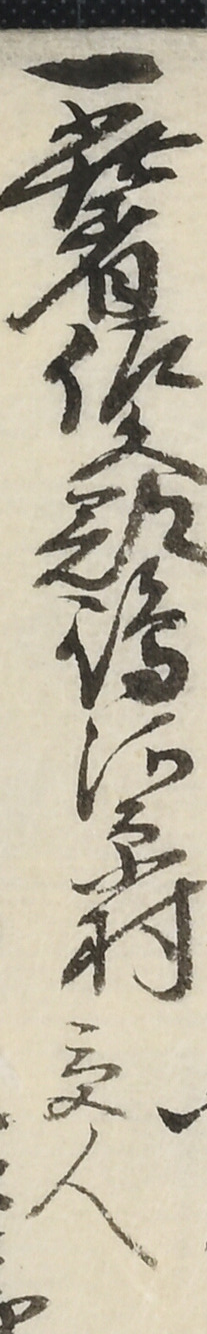一此者佐久郡嶋河原村
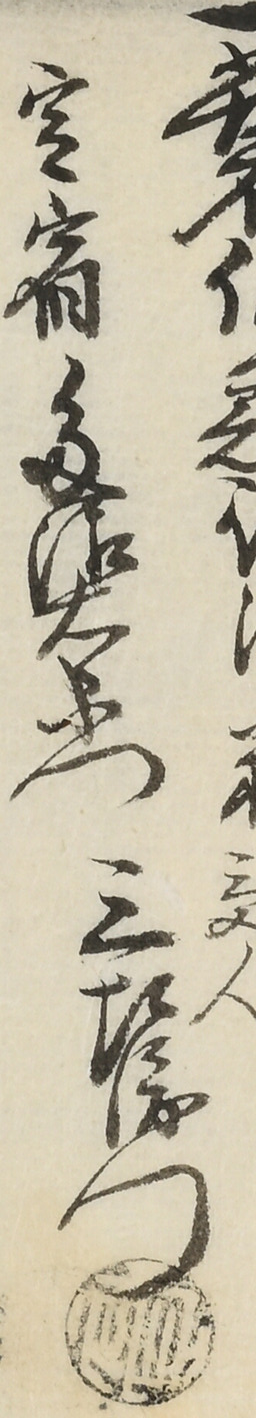定宿多治右衛門三左衛門(印)

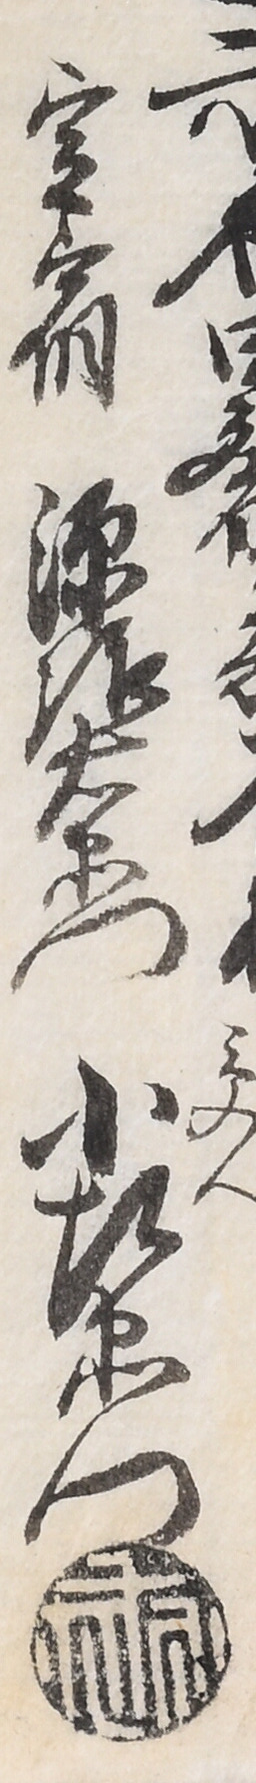定宿源治右衛門小左衛門(印)
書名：元治二乙丑年二月他國石切名前書上帳
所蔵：伊那市立高遠町図書館・合同会社AMANE
